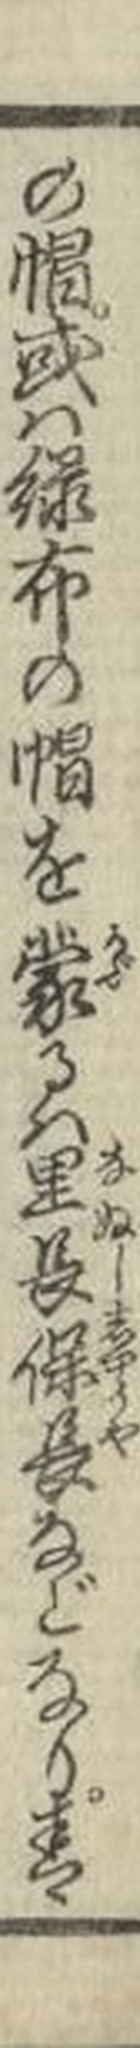の帽。或は緑布の帽を蒙るは里長保長などなり。青
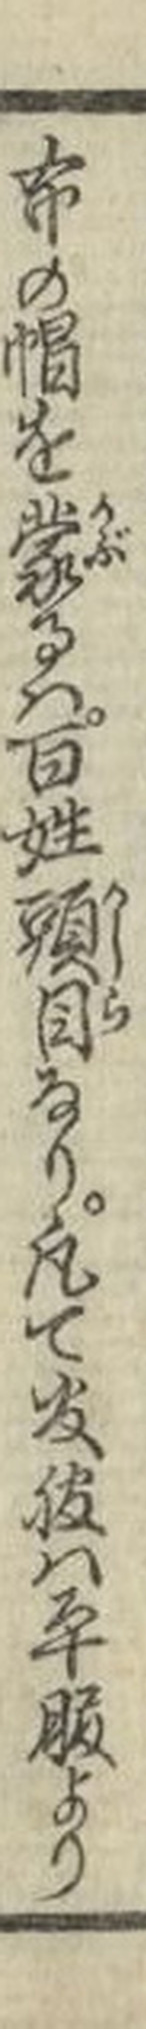布の帽を蒙るは。百姓頭目なり。凡て官服は平服より
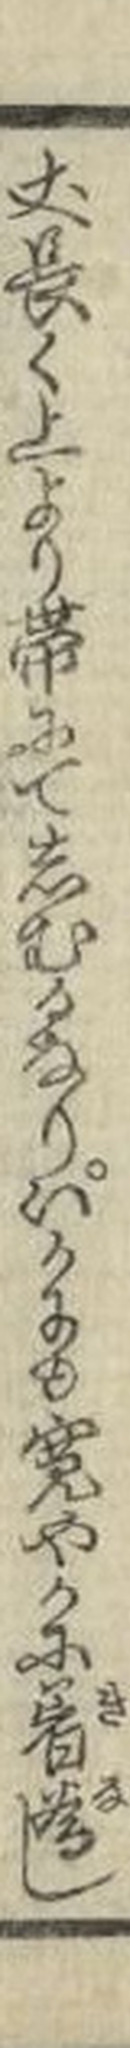丈長く上より帯にてしむるなり。いかにも寛やかに着為し
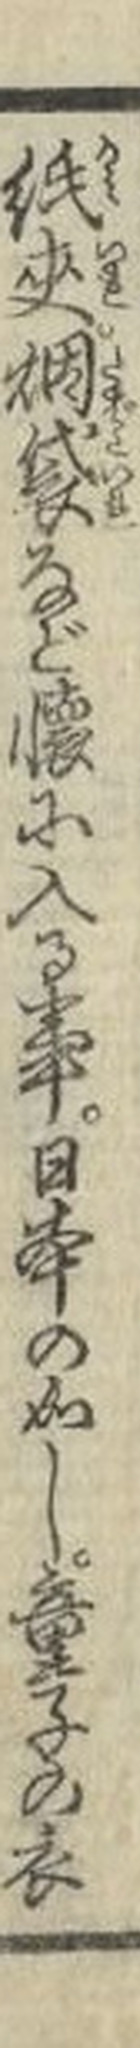紙夾。烟袋など懐に入る事。日本の如し。童子の衣
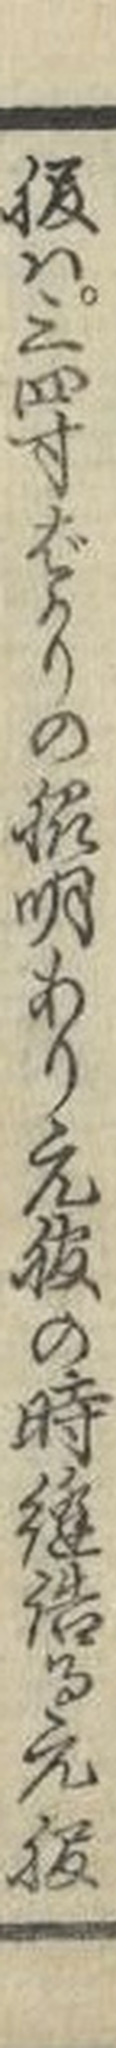服は。三四寸ばかりの脇明あり元服の時縫詰る元服

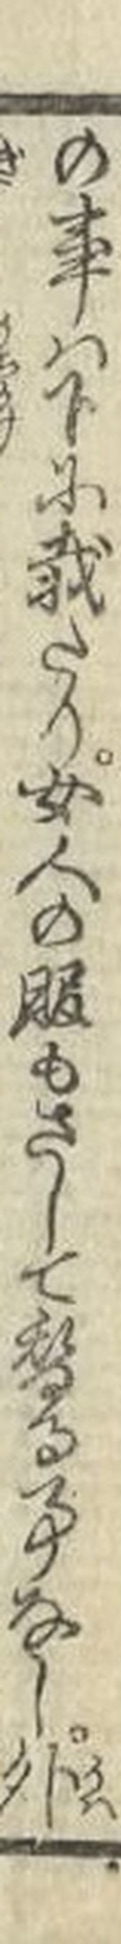の事は下に載たり。女人の服もさして替る事なし。外
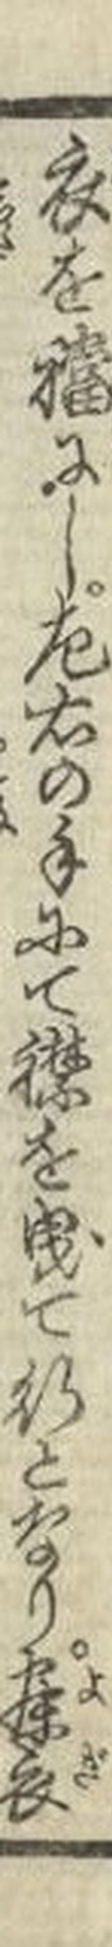衣を襠にし。左右の手にて襟を曳て行となり。寐衣
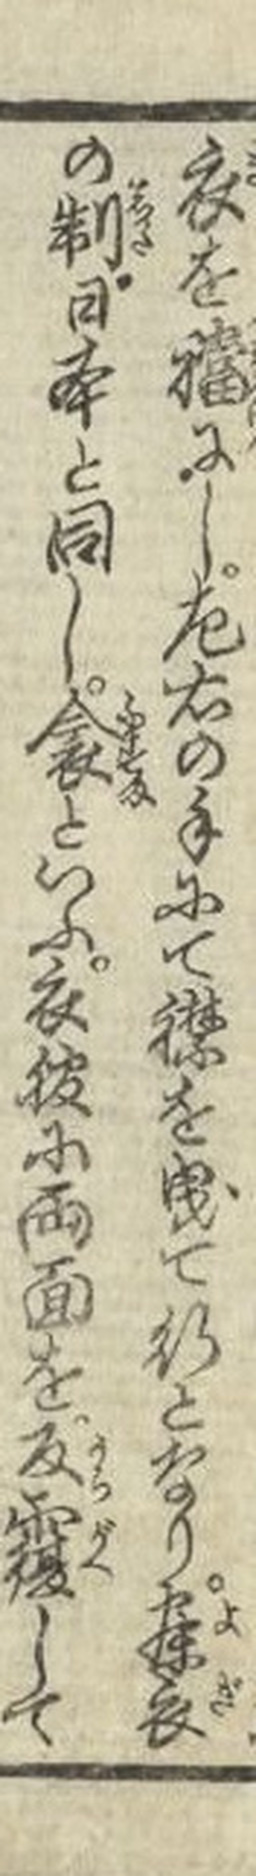の制。日本と同し。衾といふ。衣服に両面を反覆して
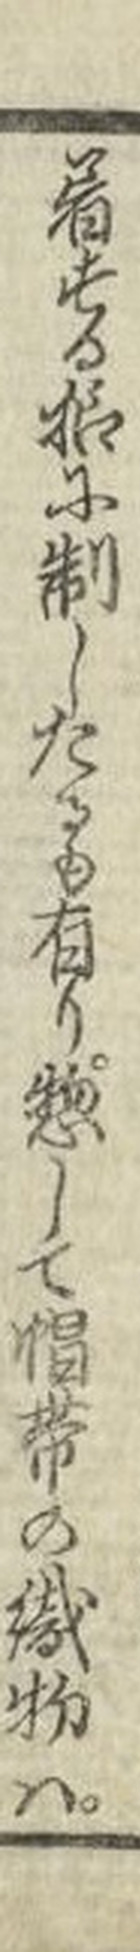着する様に制したるも有り。惣して帽帯の織物は。
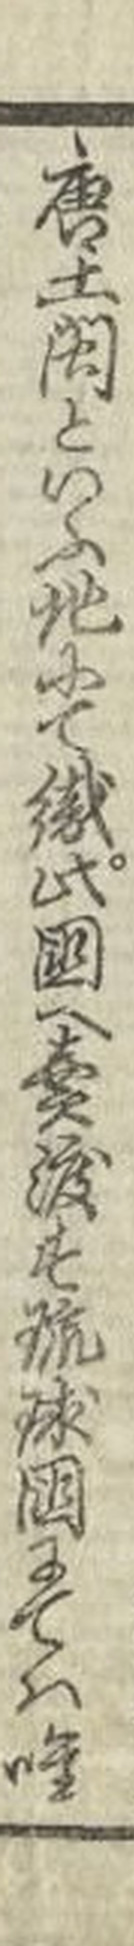唐土閩といふ地にて織。此国へ売渡す琉球国にては唯
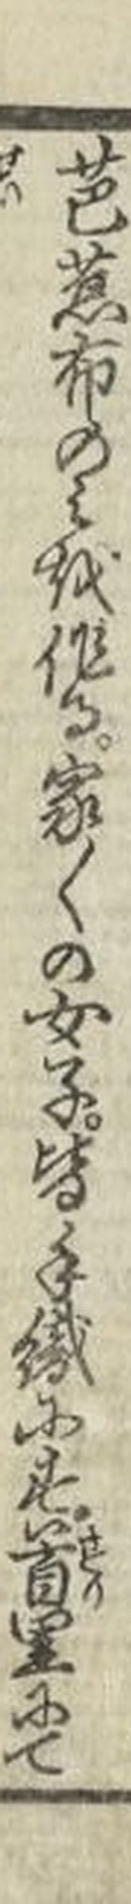芭蕉布のみを作る。家〳〵の女子。皆手織にす。首里にて
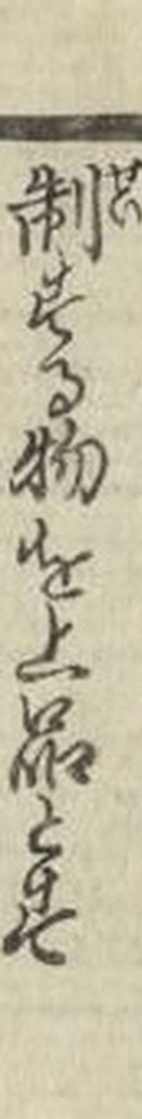制する物を上品とす
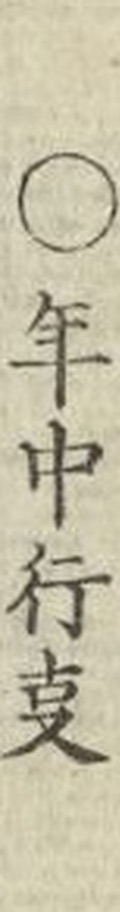○年中行事
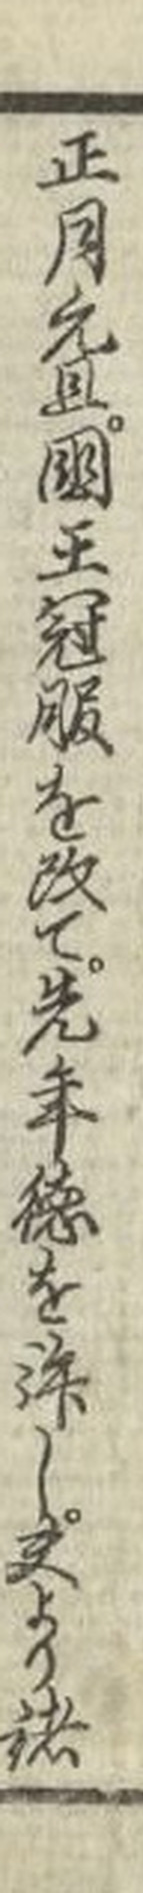正月元旦。国王冠服を改て。先年徳を拝し。夫より諸
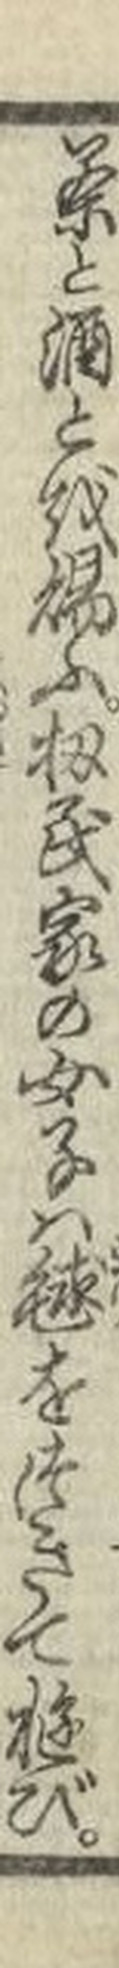茶と酒とを賜ふ。扨民家の女子は毬をつきて遊び。
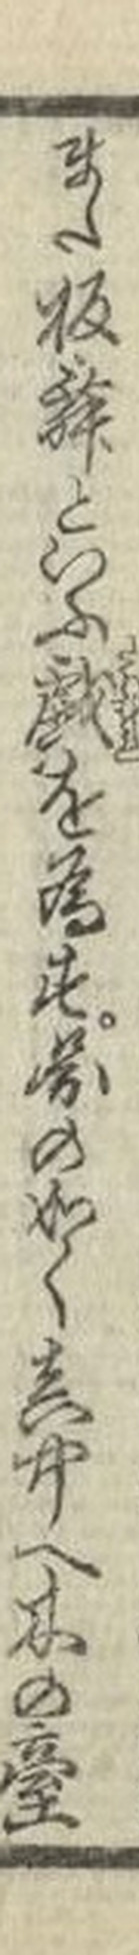また板舞といふ戯を為す。図の如く真中へ木の台
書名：琉球解語
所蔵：University of the Ryukyus Library
